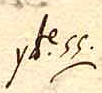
yd̄.e 55.
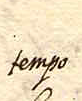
tempo
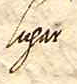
lugar
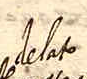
delato
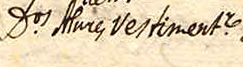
D.os Alures vestiment.ro
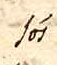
sós
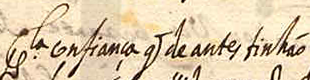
p.la confiança q̄ de antes tinhaõ
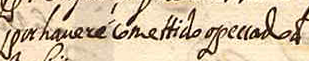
por hauerē comettido o peccado d̄
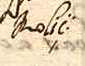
Moliç.
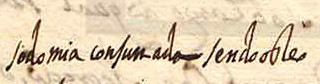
sodomia consumada sendo o Reo
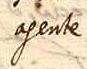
agente
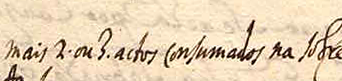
mais 2. ou 3. actos Consumados na sobre
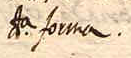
d̄.a forma.
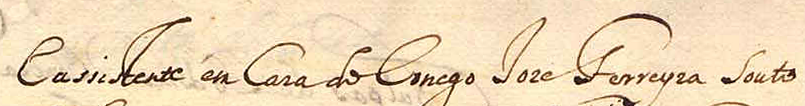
E assistente em Caza do Conego Ioze Ferreyra Souto
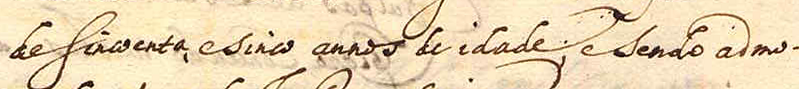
de sincoenta, e sinco annos de idade, e sendo admo
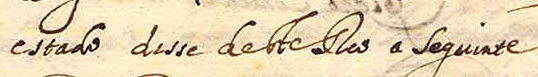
estado disse deste Reo a seguinte
